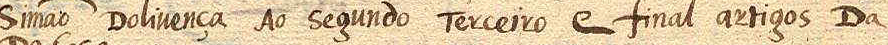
Simão Doliuença Ao Segundo Terceiro e final artigos Da
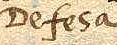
Defesa
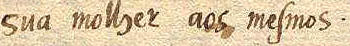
Sua molher aos mesmos.
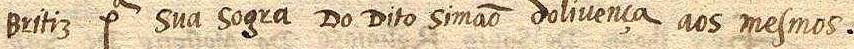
Britiz pa Sua Sogra Do Dito Simão doliuença aos mesmos.
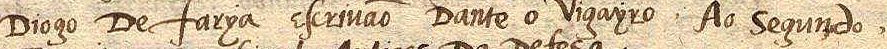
Diogo De farya Escriua̅o Dante o Vigayro, Ao Segundo,
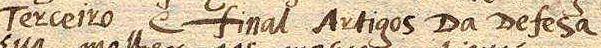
Terceiro e final Artigos Da Defesa
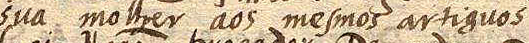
sua molher aos mesmos artiguos
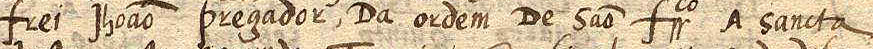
frei Jhoão pregador, Da ordem De São frrco A sancta
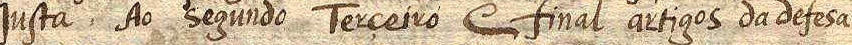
Justa, Ao segundo Terçeiro e final artigos da defesa
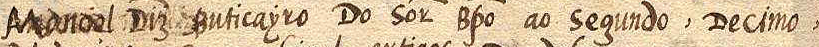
Manoel D̅iz Buticayro Do Sōr B̅po ao Segundo, Decimo,
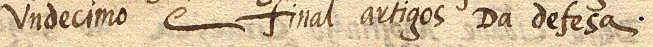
Vndecimo e final artigos Da defesa.
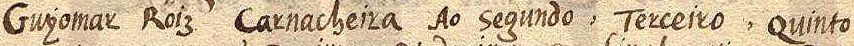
Guyomar Ro̅iz Çarnacheira Ao segundo, Terceiro, Quinto
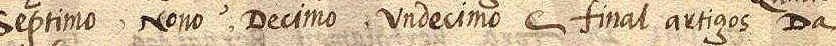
Septimo, Nono, Decimo, Vndecimo e final artigos Da
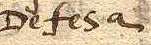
Defesa
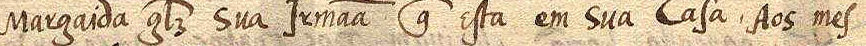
Margaida g̅lz Sua Jrmāa q̅ Esta em Sua Casa, Aos mes
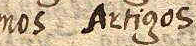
mos Artigos
